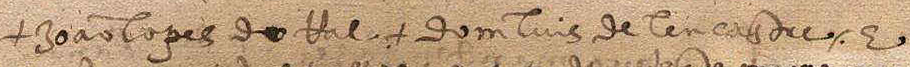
+ João lopes do Ral + dom luis de lencastre /. E
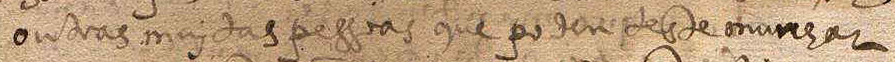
outras mujtas pessoas que poden testemunhar
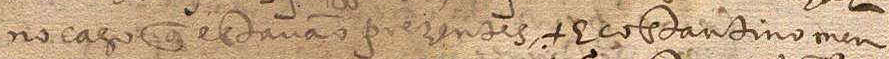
no caso q̄ estauão prezentes, + E costantino men
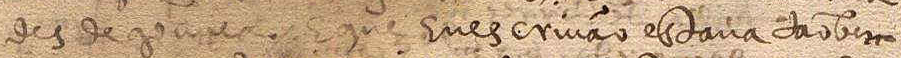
des de gouuea / E que Eu escriuão estaua taõbem
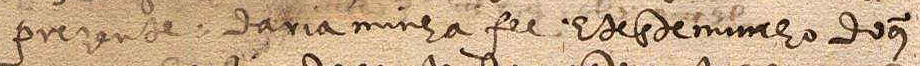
prezente: daria minha fee E testemunho do q̄
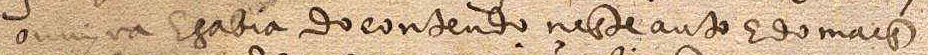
ouujra E sabia do conteudo neste auto E do mais
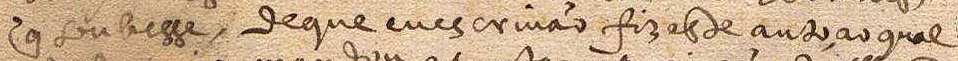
q̄ soubesse, de que eu escriuão fiz este auto, ao qual
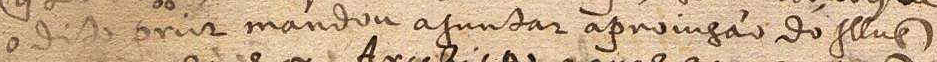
o dito prior mandou ajuntar a prouisão do Jllus
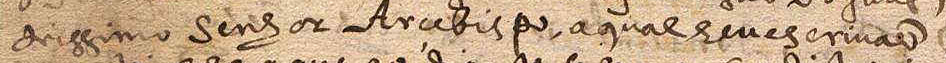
trissimo Senhor Arcebispo, a qual heu escriuaõ
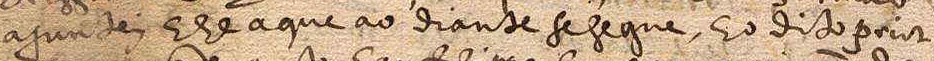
ajuntej E he a que ao diante se segue, E o dito prior
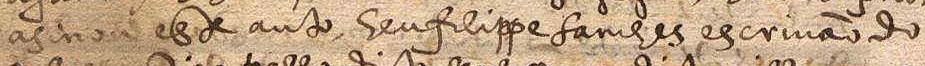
asinou este auto, E eu filippe sanches escriuão do
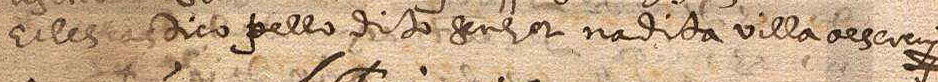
Eclesiastico pello dito senhor na dita villa o escreuj
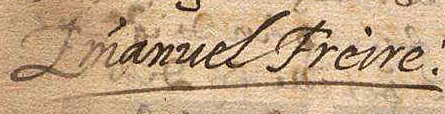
Em̄anuel Freire
